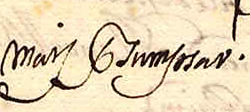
mais p̄sumpsar̄.
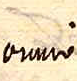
ouuio
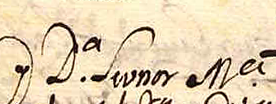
q D.a Leonor M.a
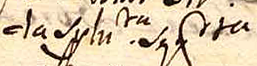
da Sylu.ra se q̄ria
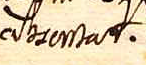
abzentar.
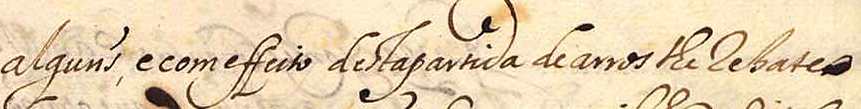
algun̄s, e com effeito desta partida de arros lhe Rebateo
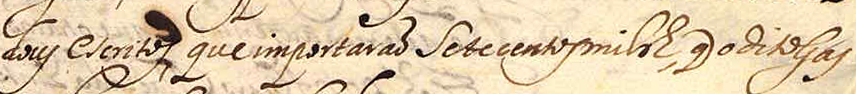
dous escritos, que importaraõ setecentos mil rs̄, q̄ o dito Gas
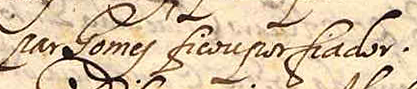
par Gomes ficou por fiador.
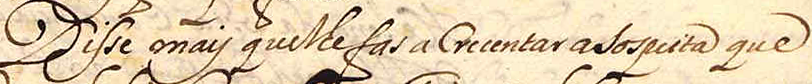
Disse mais que lhe fas aCrecentar a sospeita que
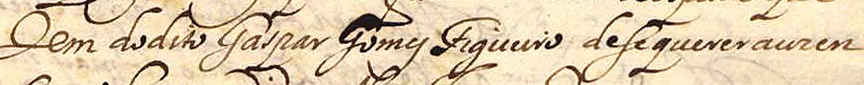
tem do dito Gaspar Gomes Figueiro de se querer auzen
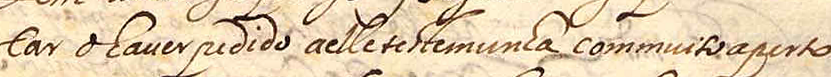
tar o hauer pedido a elle testemunha com muito aperto
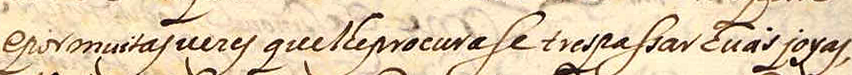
e por muitas uezes que lhe procurase trespassar huas joyas,
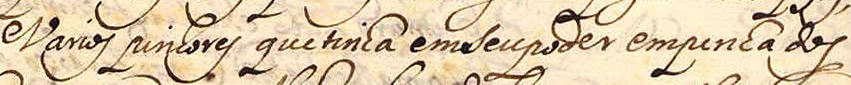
e Varios pinhores que tinha em seu poder empenhados
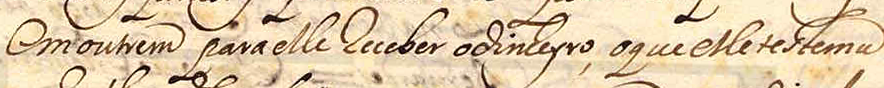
em outrem para elle Receber o dinheyro, o que elle testemu
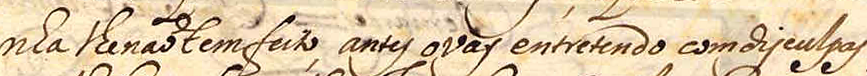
nha lhe naõ tem feito, antes o vay entretendo com disculpas
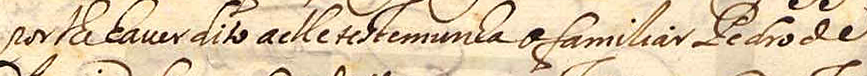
por lhe hauer dito a elle testemunha o familiar Pedro de
